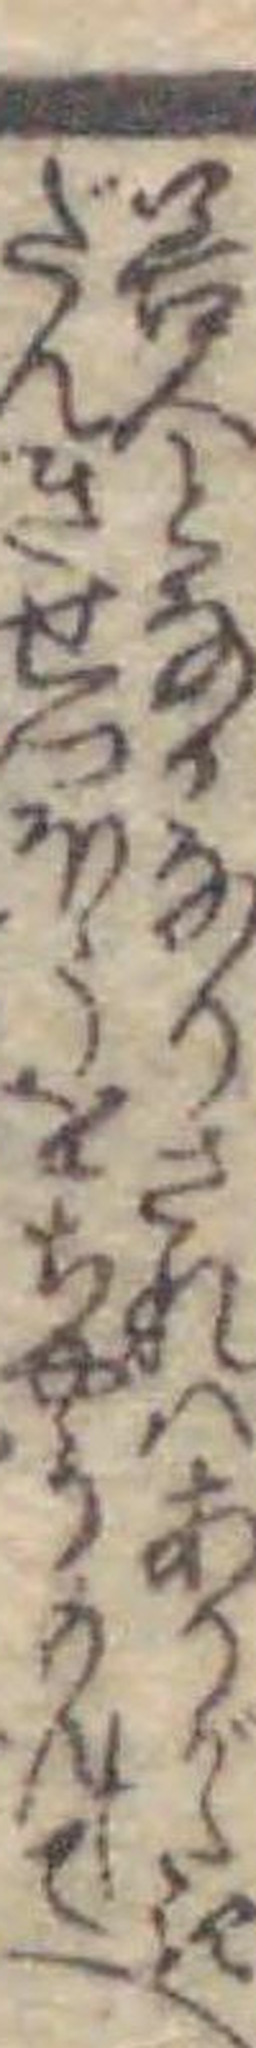だんきせつほうをしやうもんして
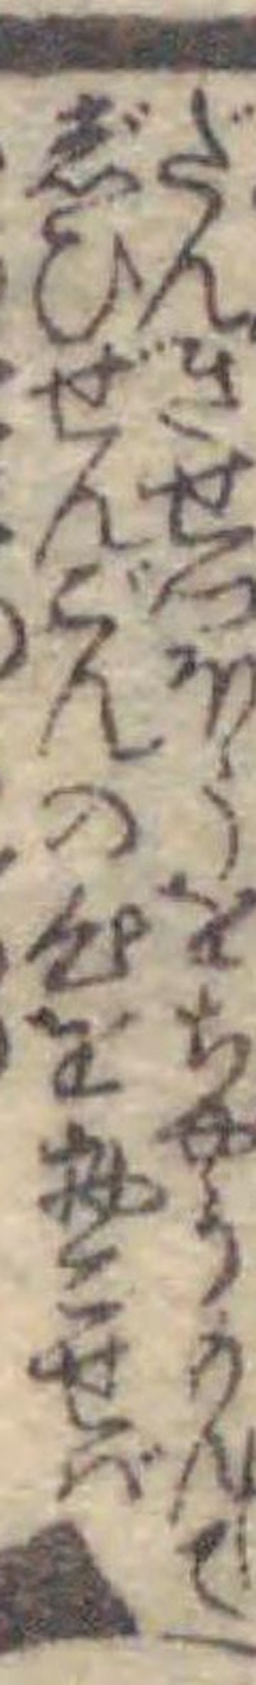じひぜんごんの心をおこせば
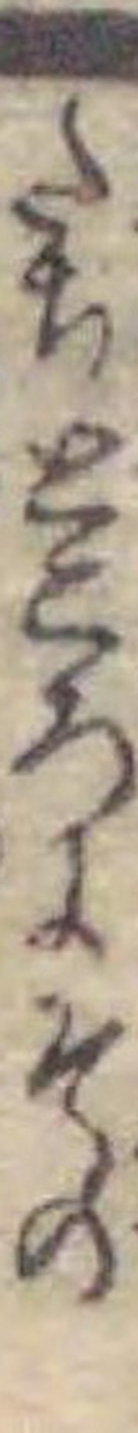たちところにその
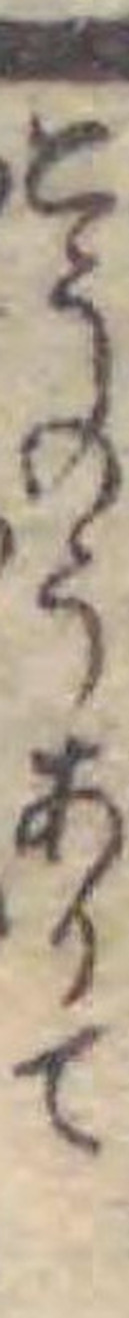おうのうありて
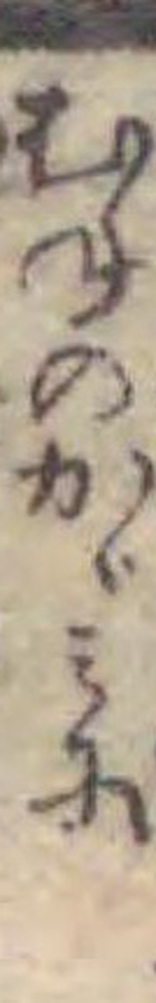むねのかゞみに
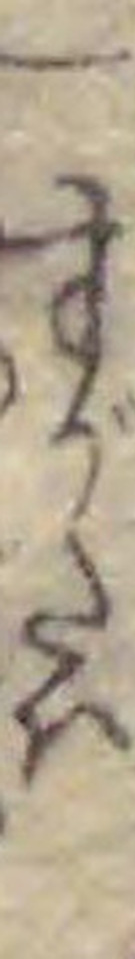すがたは
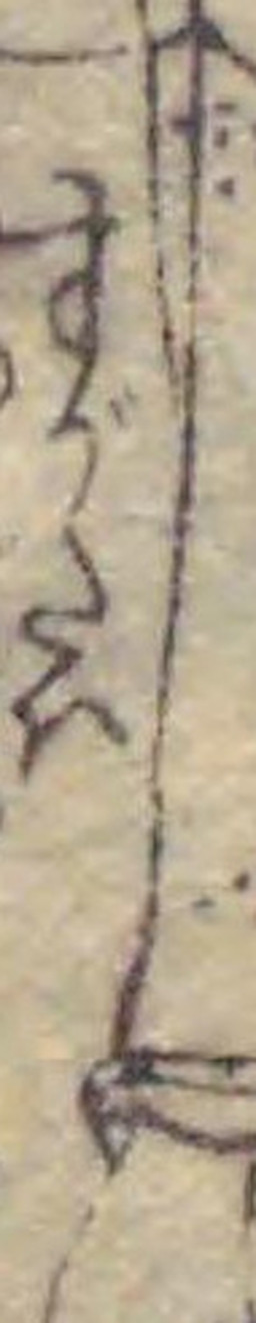すがたは
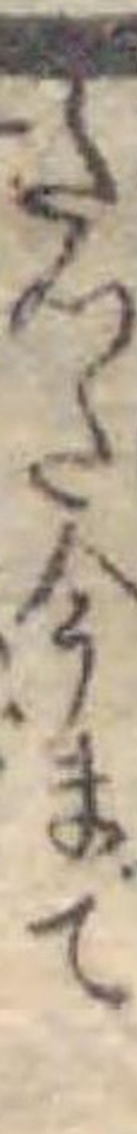たつた今まで
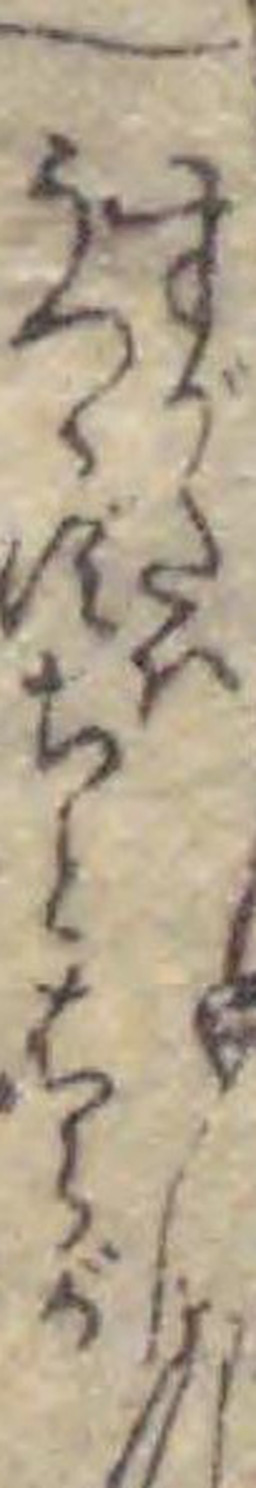うつらずちとはらが
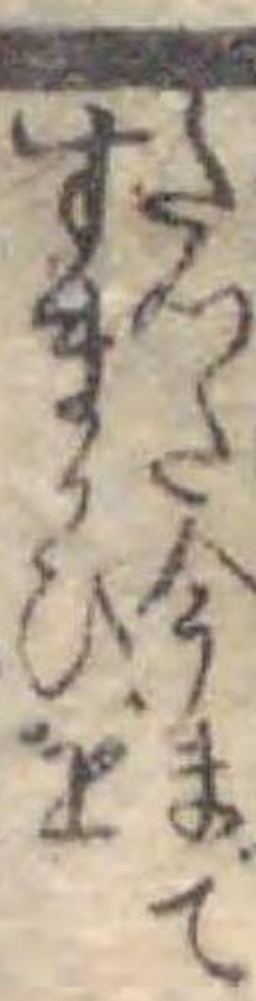すまかひを
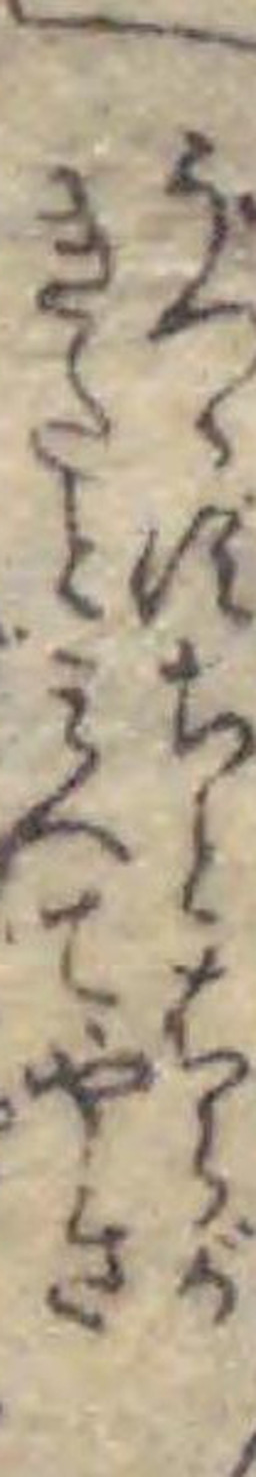きたとみへてやき
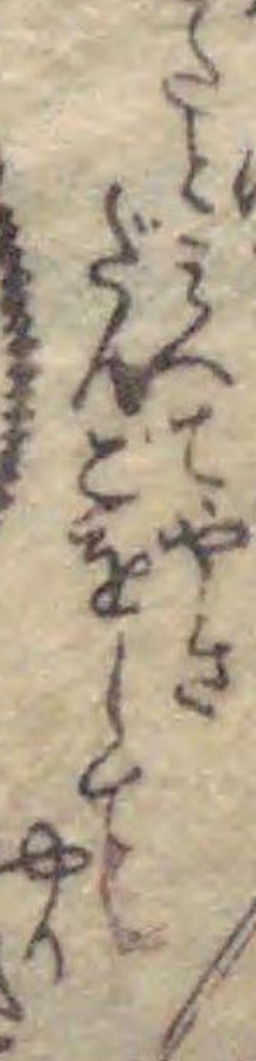だんんごをして
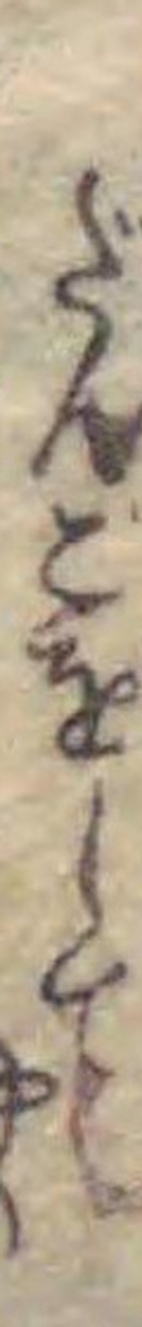だんんごをして
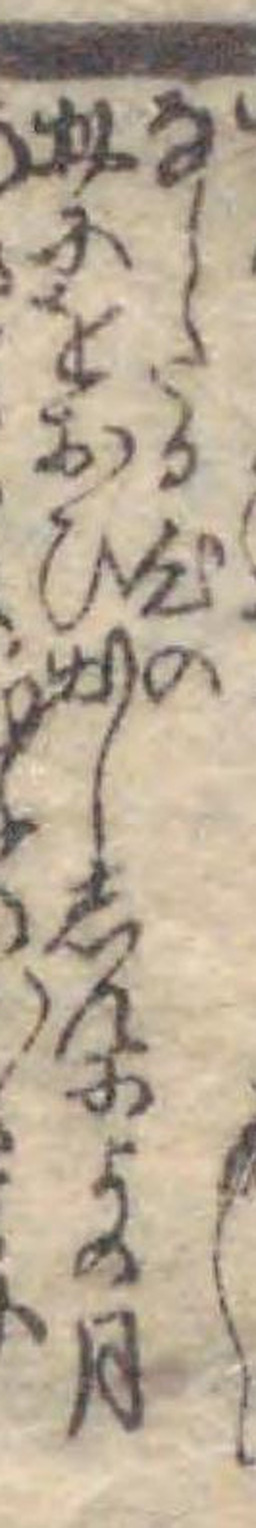おにをおひ出ししんによの月
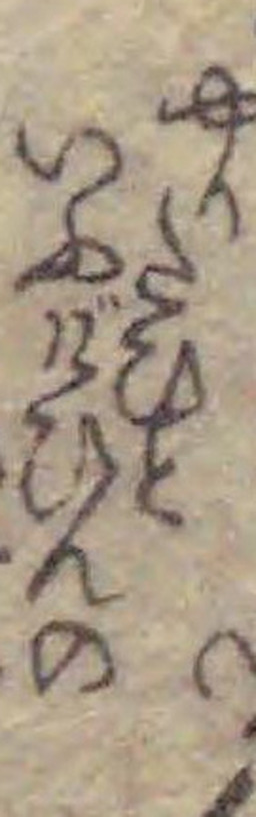いふげひんの
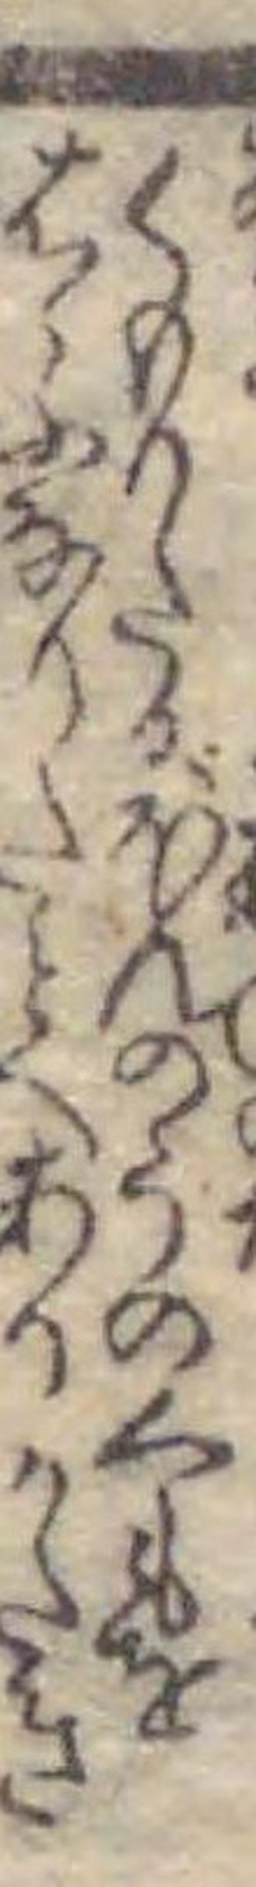はらふなりたとへありかたき
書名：人心鏡写絵 : 3巻
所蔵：国立国会図書館 National Diet Library, JAPAN
